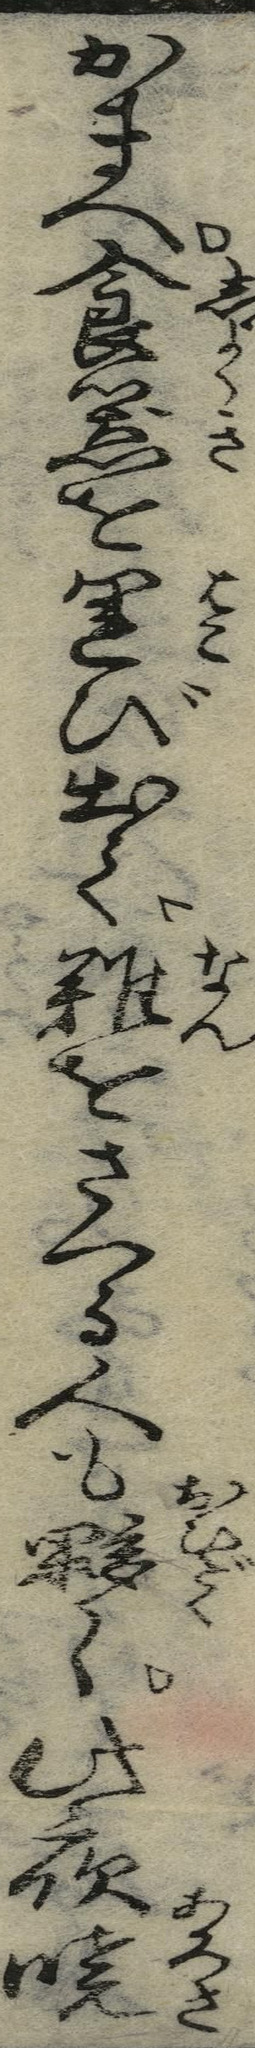かまへ。食器を運び出て。難をさくる人も夥し。此夜暁
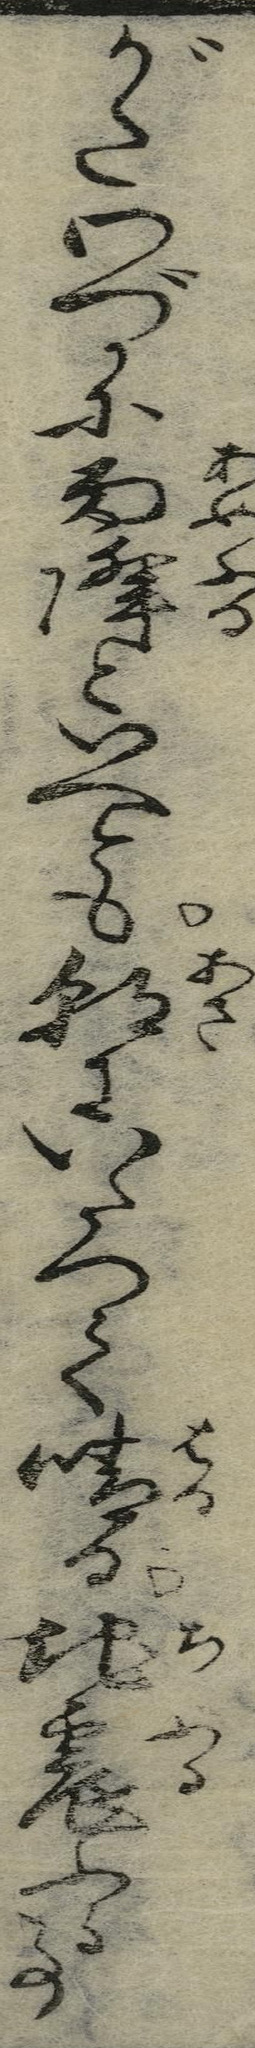がたわづかに雨降といへとも。朝にいたつて晴る。地震ふる事
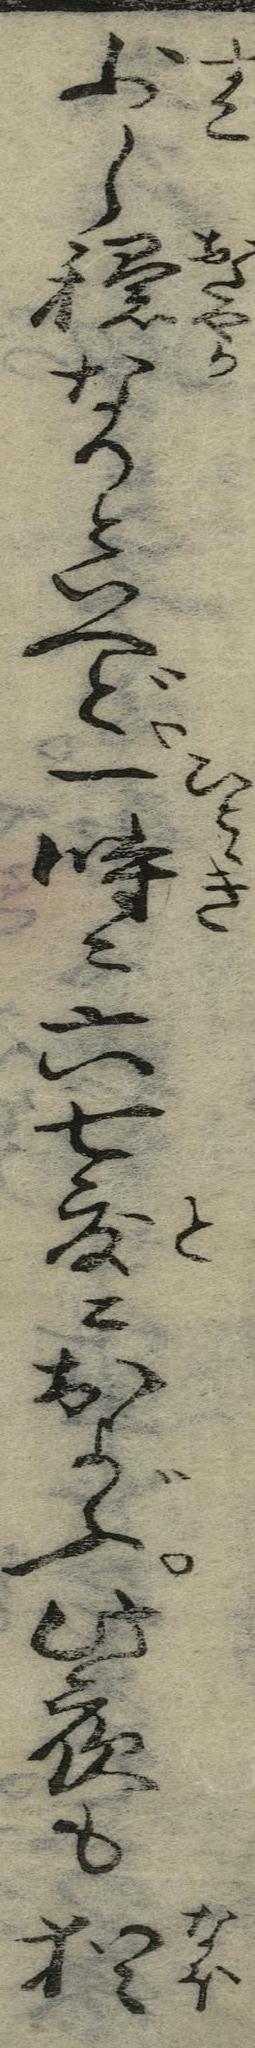少し穏なりといへど。一時に六七度におよぶ。此夜も猶

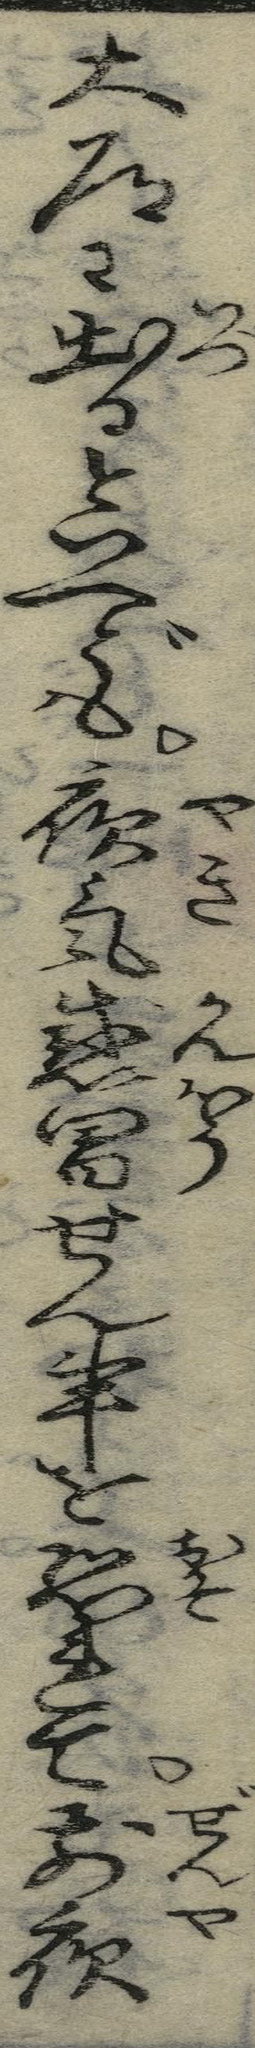大道に出るといへども。夜気感冒せん事を恐れて。前夜
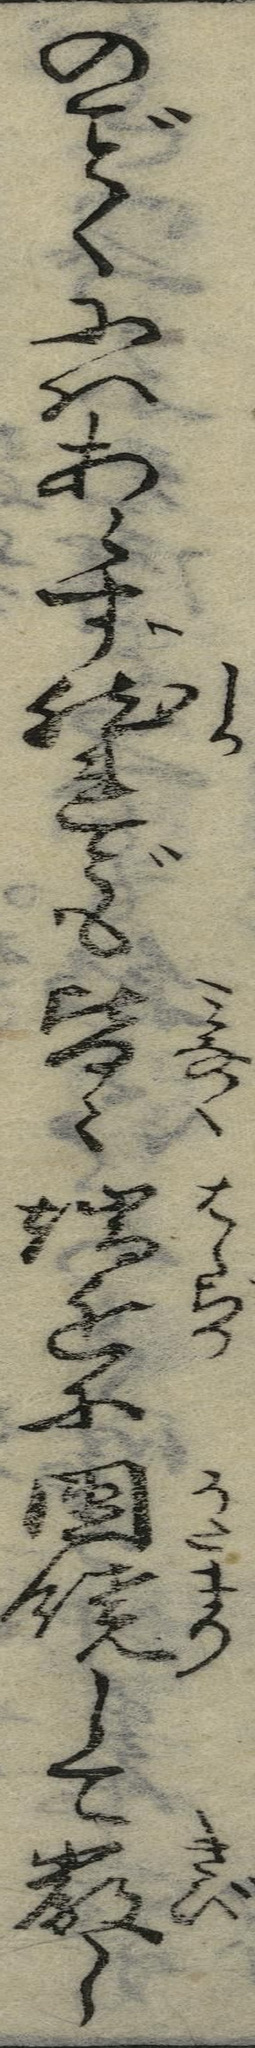のごとくにはあらず然れども皆々端近に囲繞して厳し
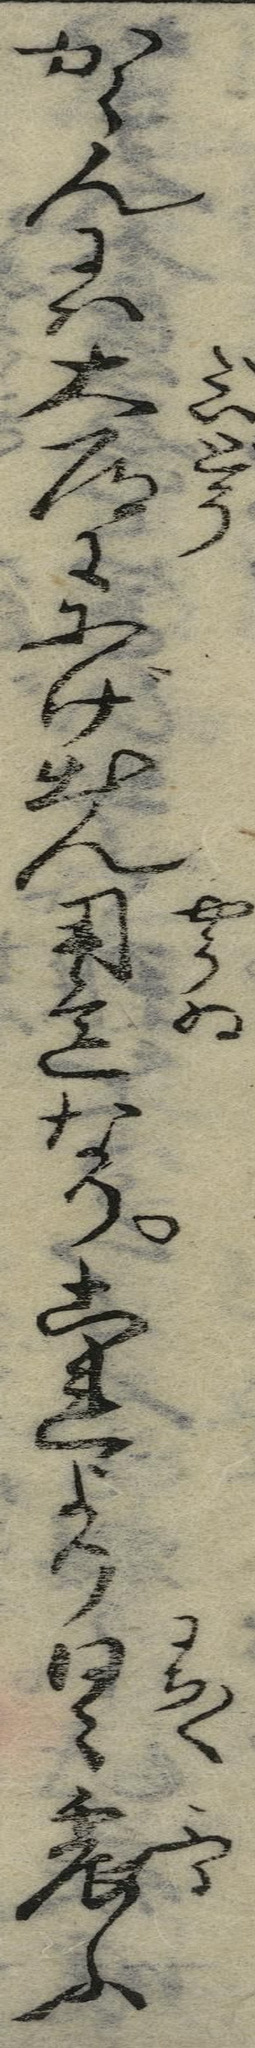からんには大道ににげ出ん用意なり。これより日々震ふ
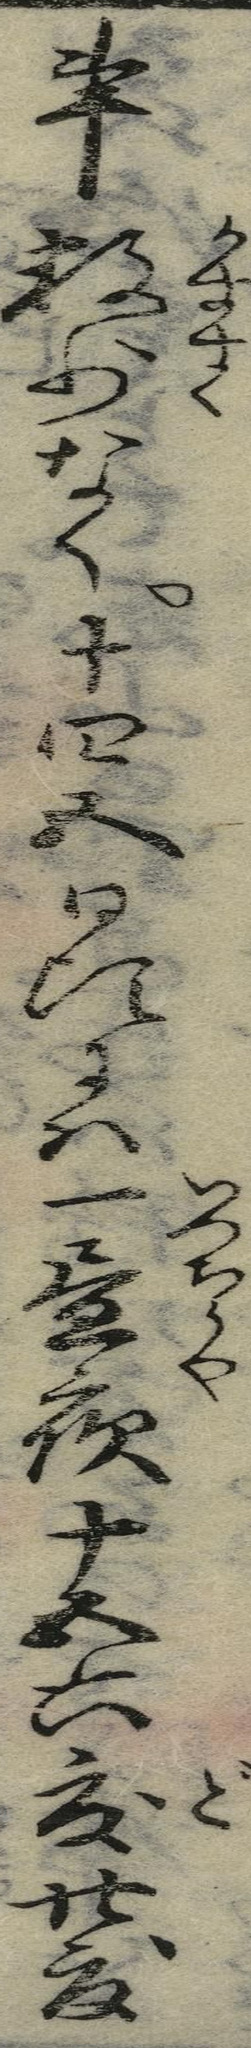事数少なく。十四五日頃には一昼夜十五六度廿度
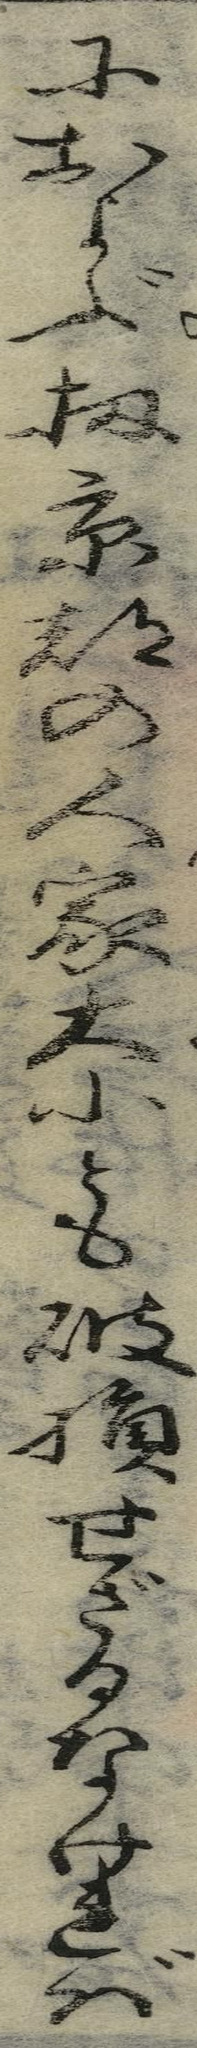におよぶ。扨京都の人家大小とも破損せざるなければ
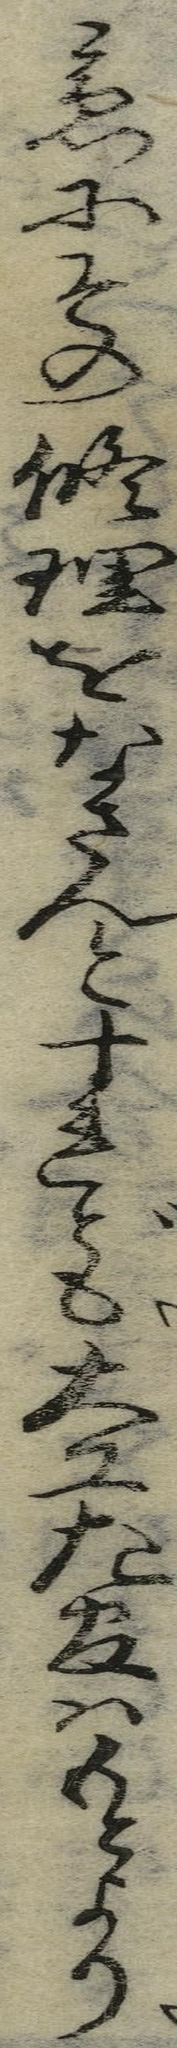急にその修理をなさんとすれども。大工左官はもとより。
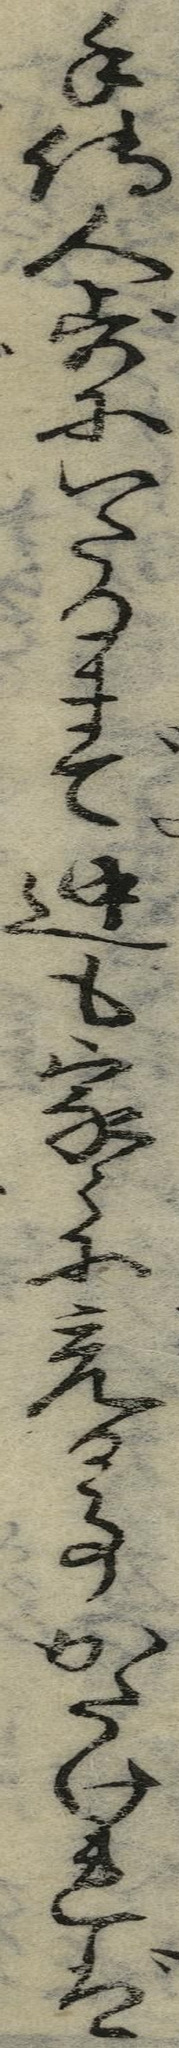手伝人歩にいたるまで。迚も家々に充る事かたければ。
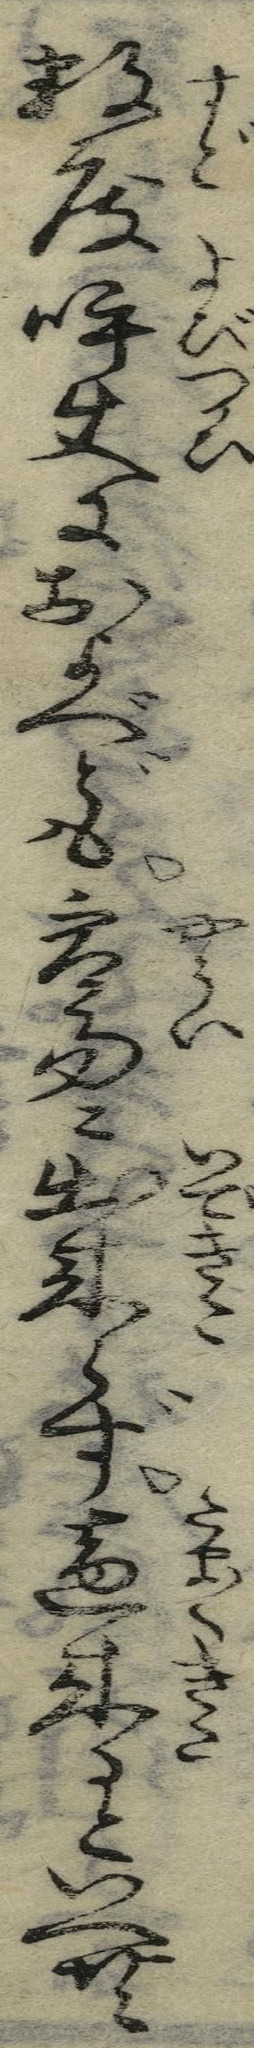数度呼吏におよべども。容易に出来らず。適来るといへ共
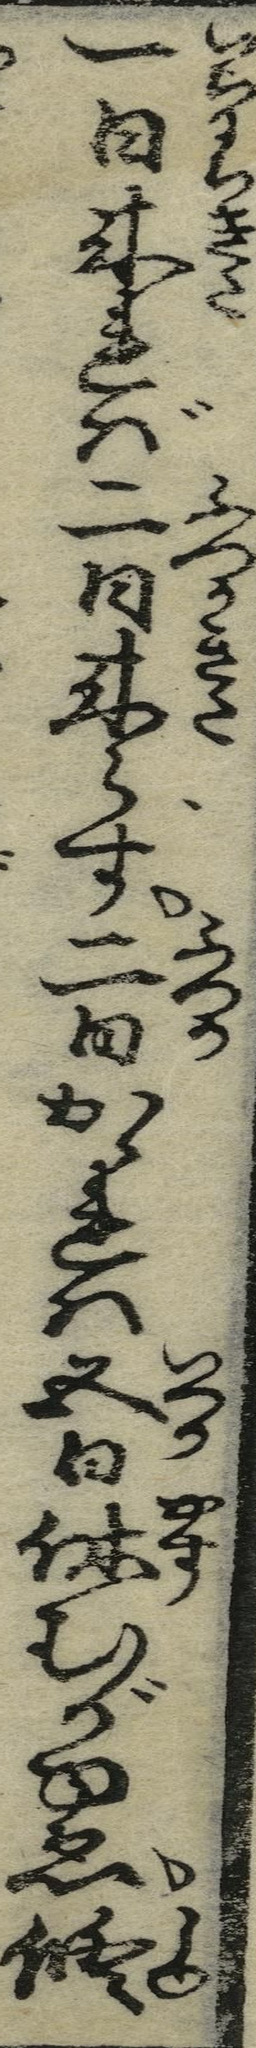一日来れば二日来らす。二日かゝれば五日休むがゆゑ。修
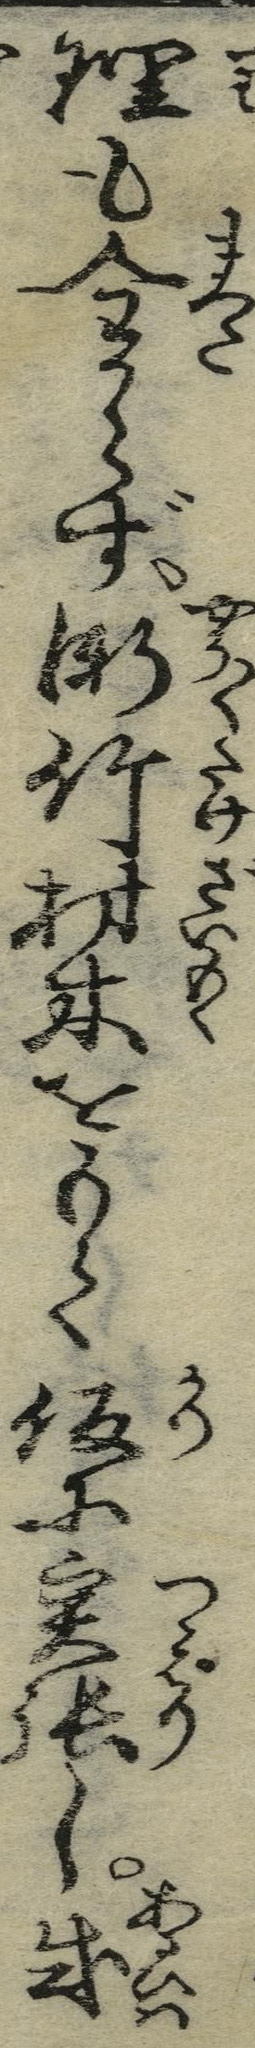理も全からず。漸竹材木をもて仮に突張し。或
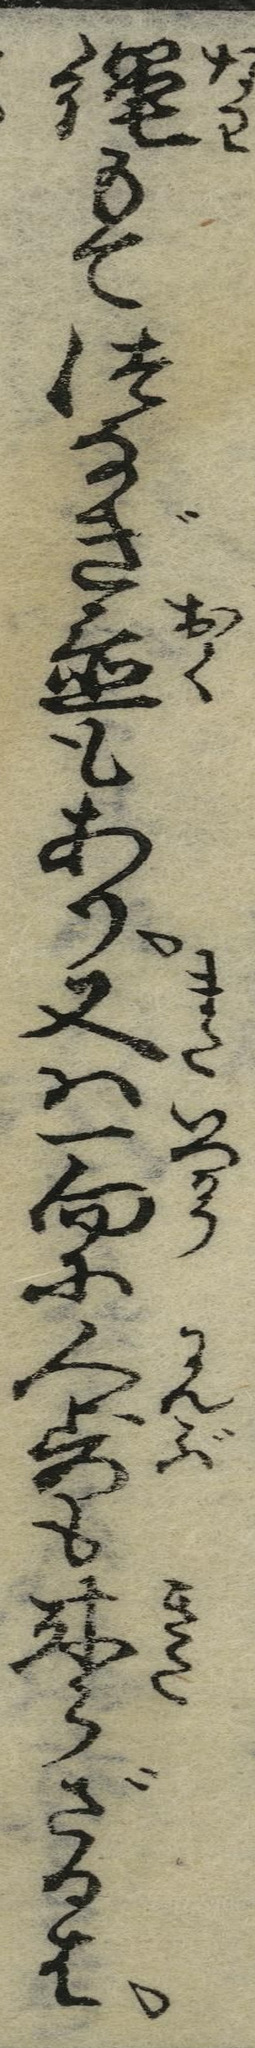縄もてつなぎ置もあり。又は一向に人歩も来らざるは。
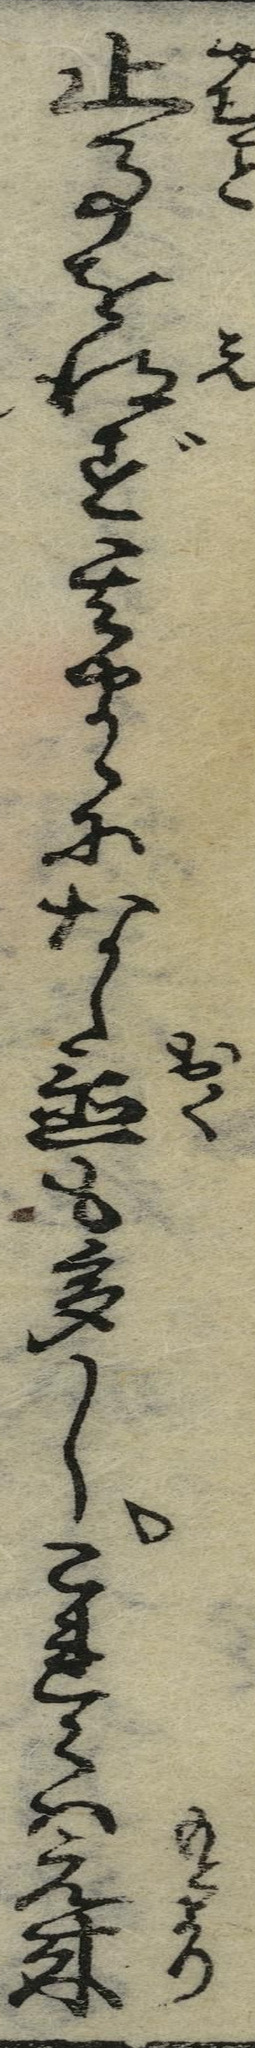止事を得ず其まゝになし置も多し。これらは元来
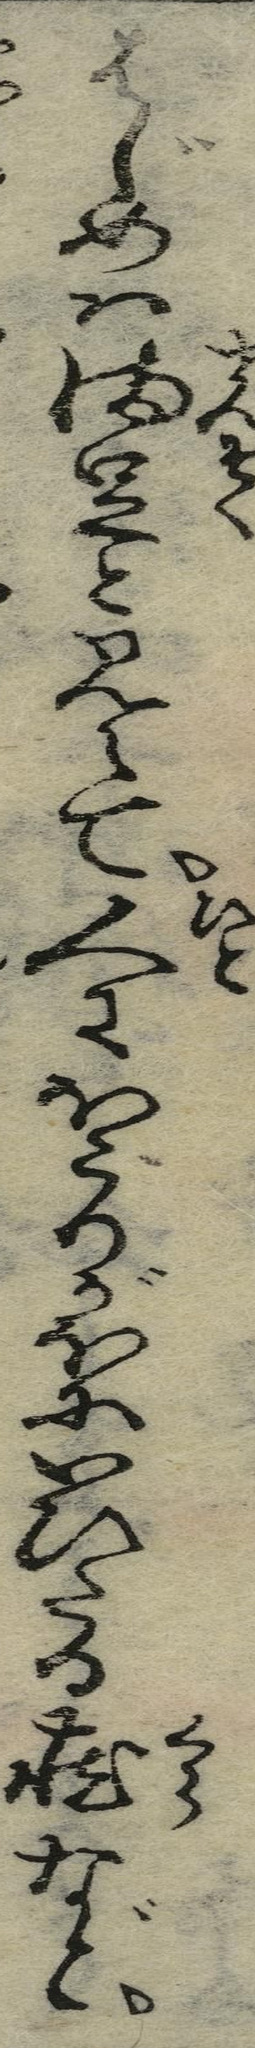はじめは満足と見えて。人にほこりがほにいひたる蔵など。
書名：本朝地震記　全
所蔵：東京大学地震研究所図書室 Earthquake Research Institute Library, The University of Tokyo, JAPAN
